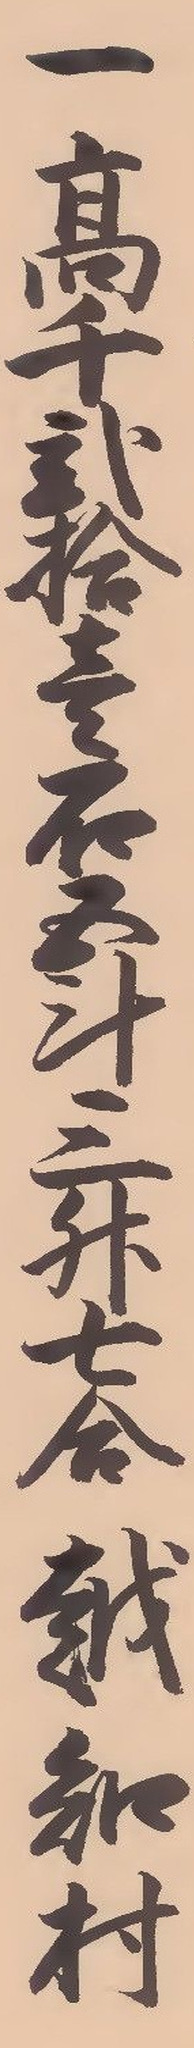一高千弐拾壱石五斗三升七合越知村
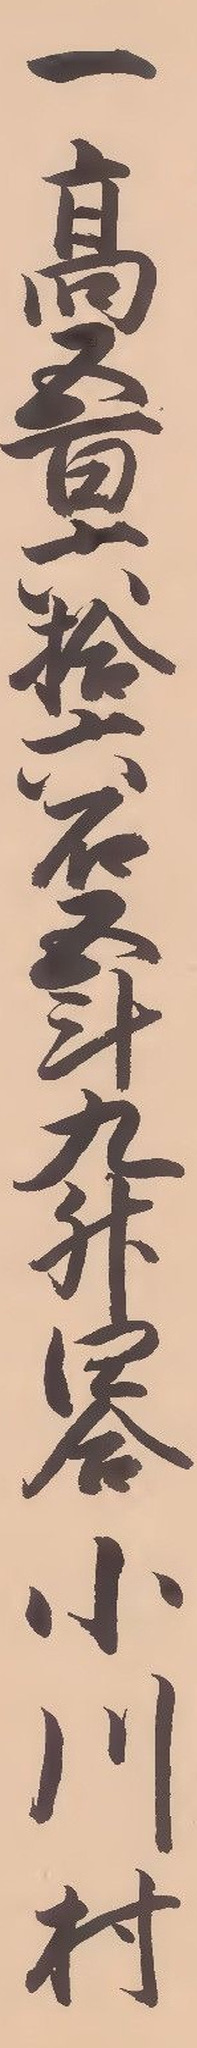一高五百六拾六石五斗九升四合小川村
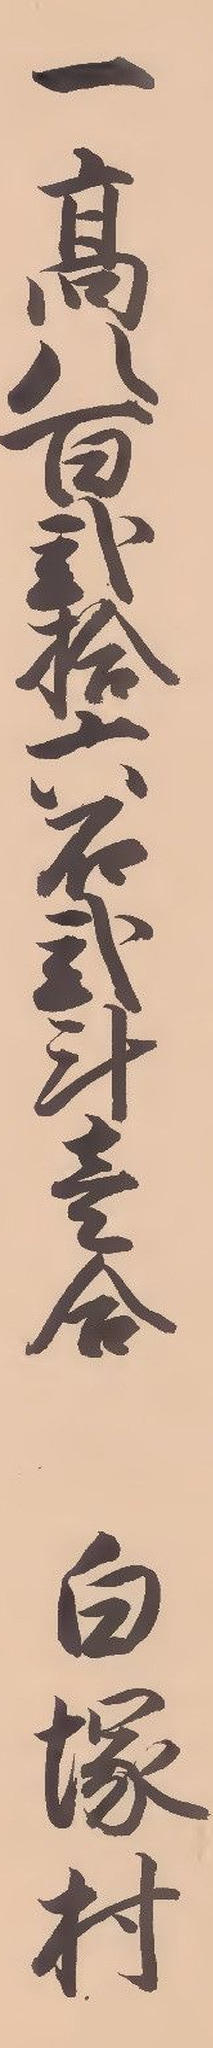一高八百弐拾六石弐斗壱合白塚村
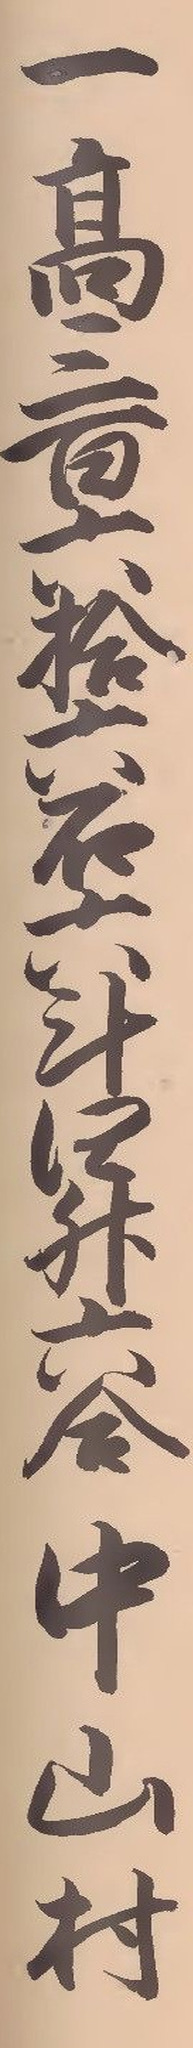一高三百六拾六石六斗四升六合中山村
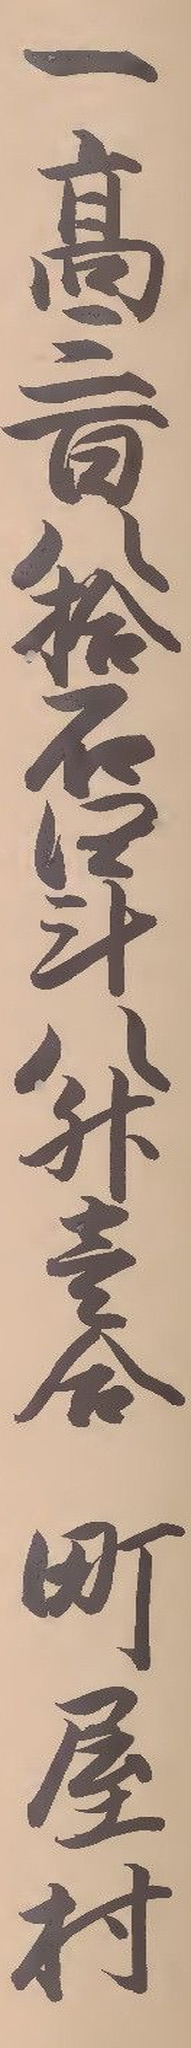一高三百八拾石四斗八升壱合町屋村
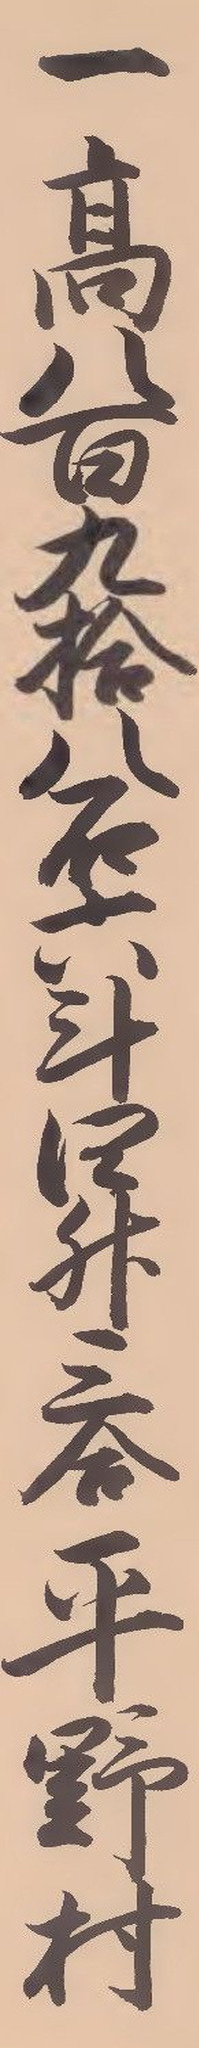一高八百九拾八石六斗四升三合平野村
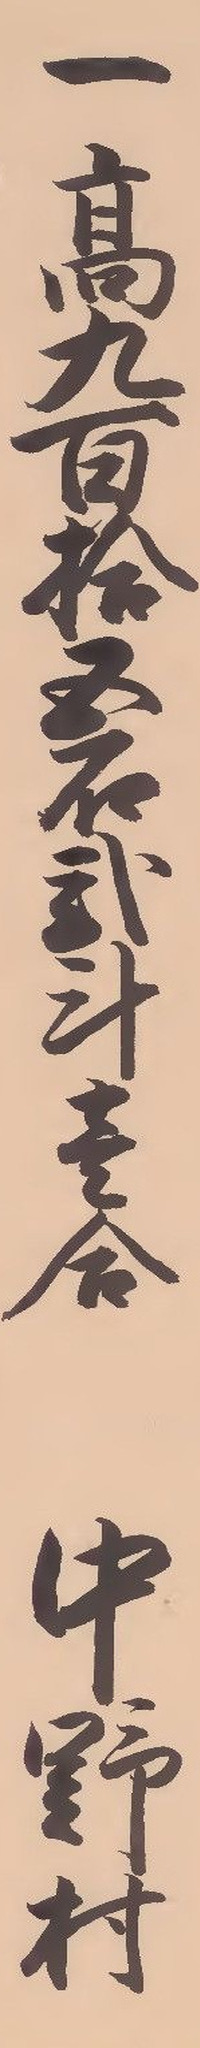一高九百拾五石弐斗壱合中野村
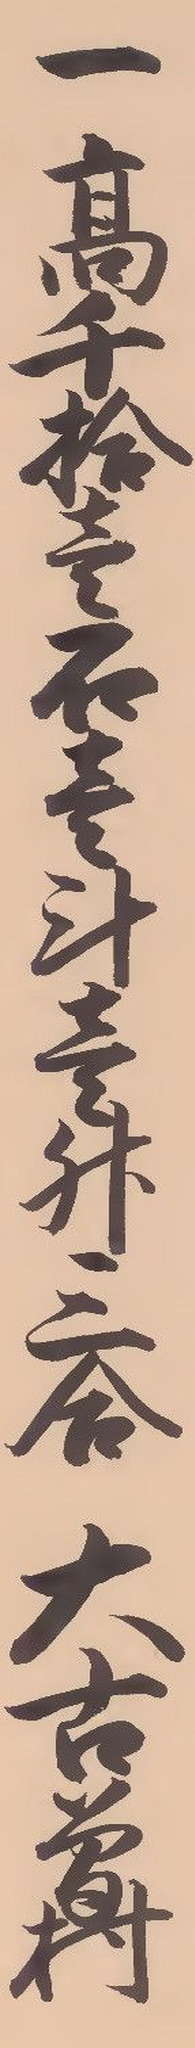一高千拾壱石壱斗壱升三合大古曽村

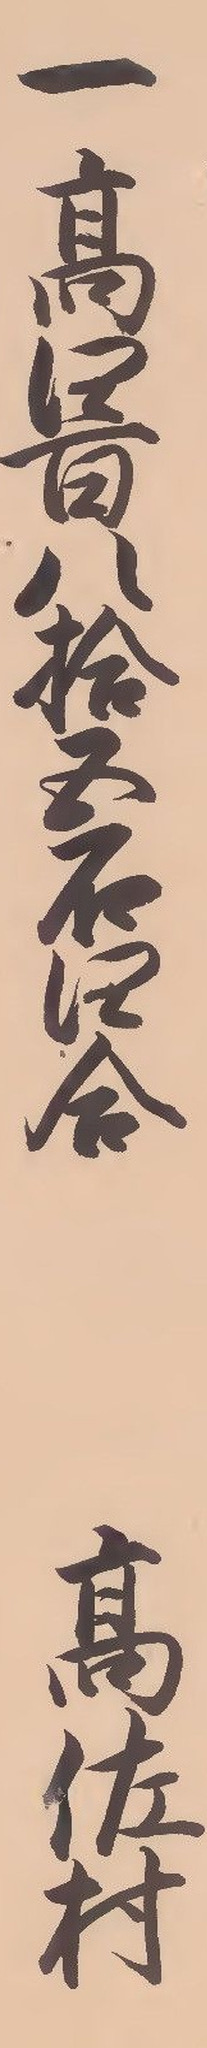一高四百八拾五石四合高佐村
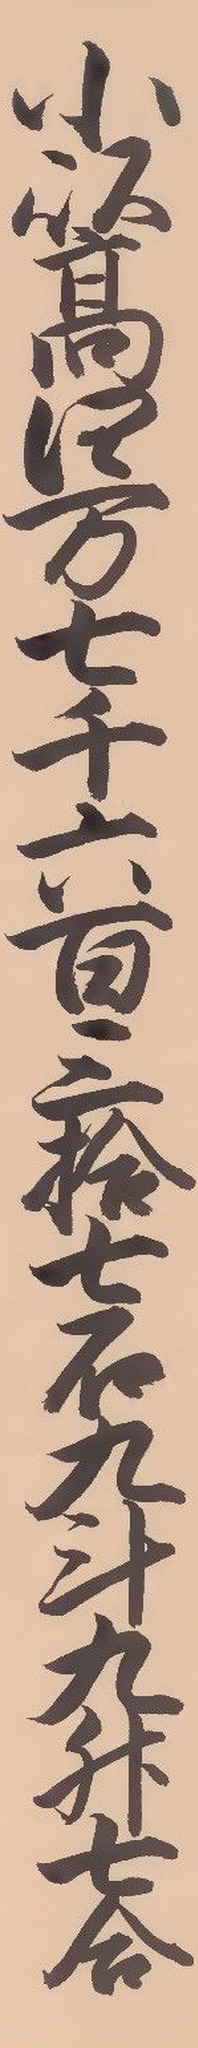小以高四万七千六百三拾七石九斗九升七合
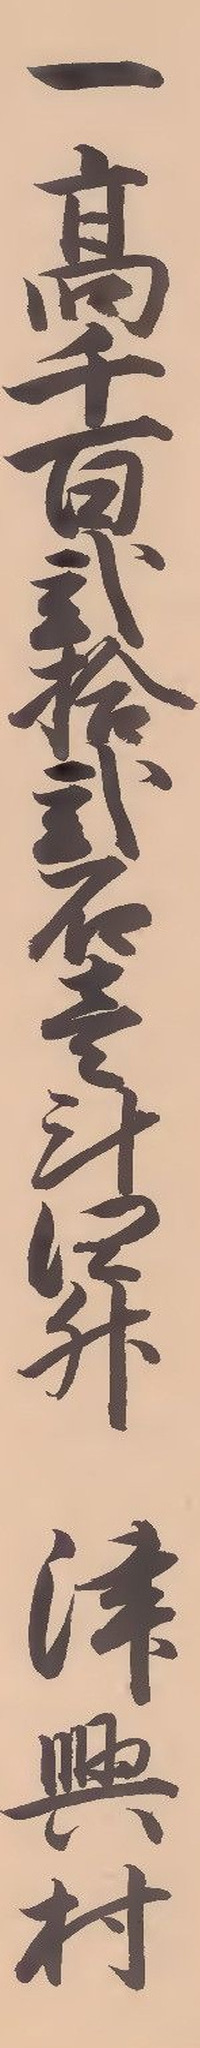一高千百弐拾弐石壱斗四升津興村
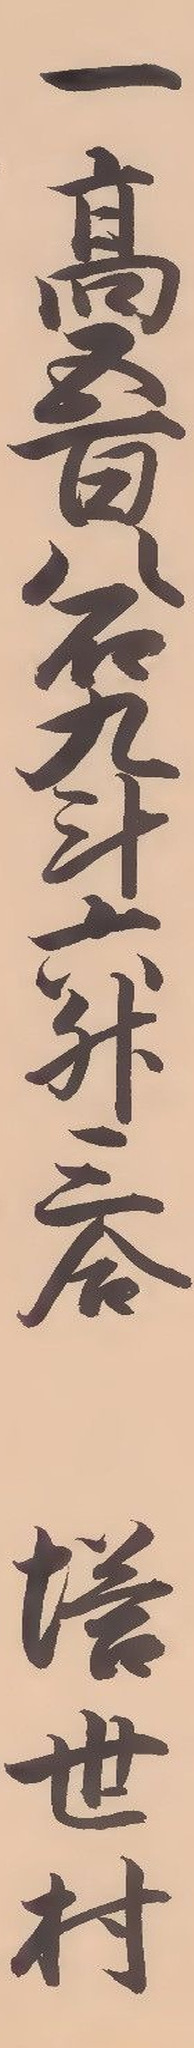一高五百八石九斗六升三合塔世村
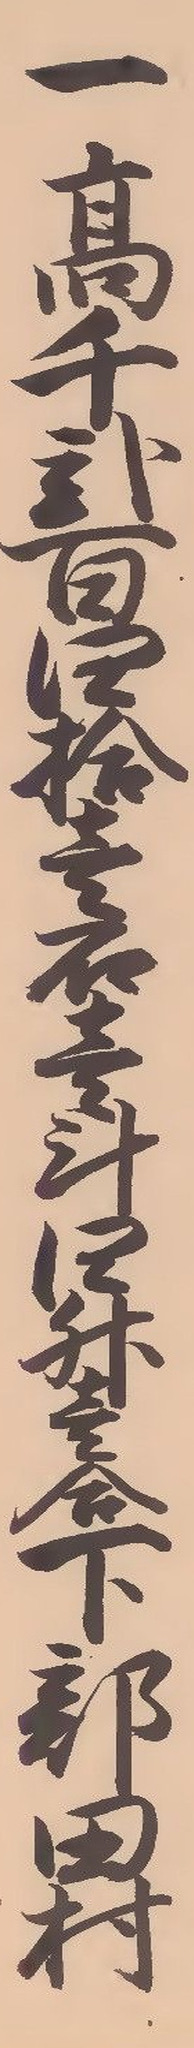一高千弐百四拾壱石壱斗四升壱合下部田村

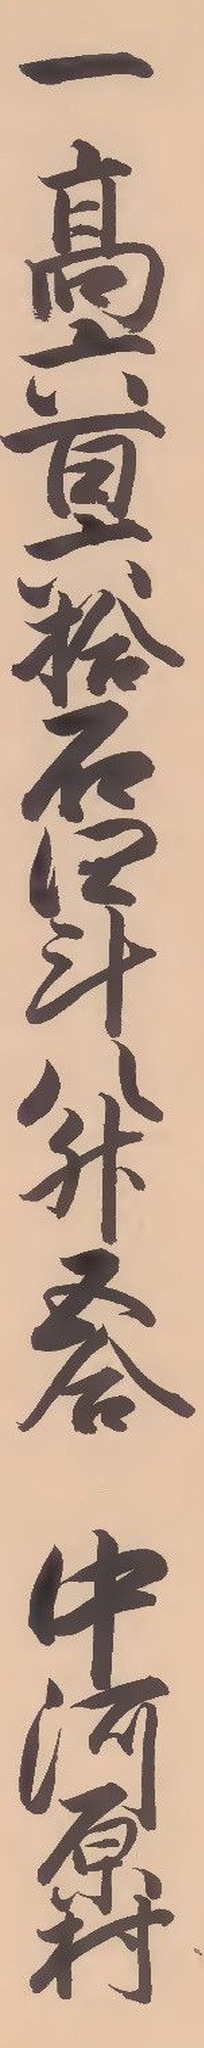一高六百六拾石四斗八升五合中河原村
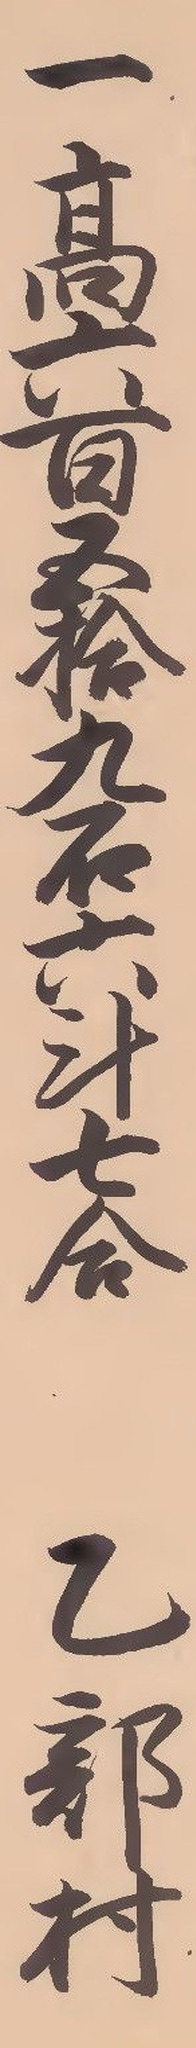一高六百五拾九石六斗七合乙部村
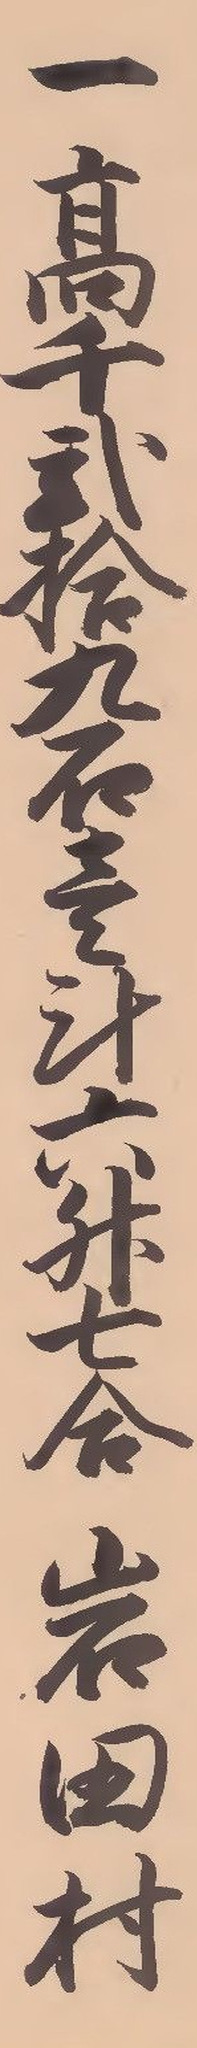一高千弐拾九石壱斗六升七合岩田村
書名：伊勢国郷帳
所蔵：国立公文書館 National Archives of Japan
